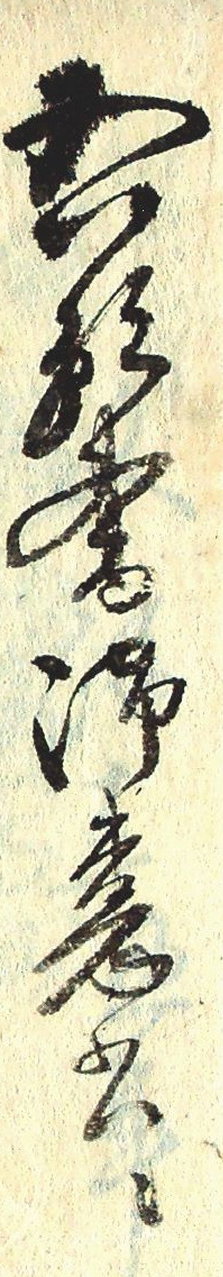右願書御裏書也
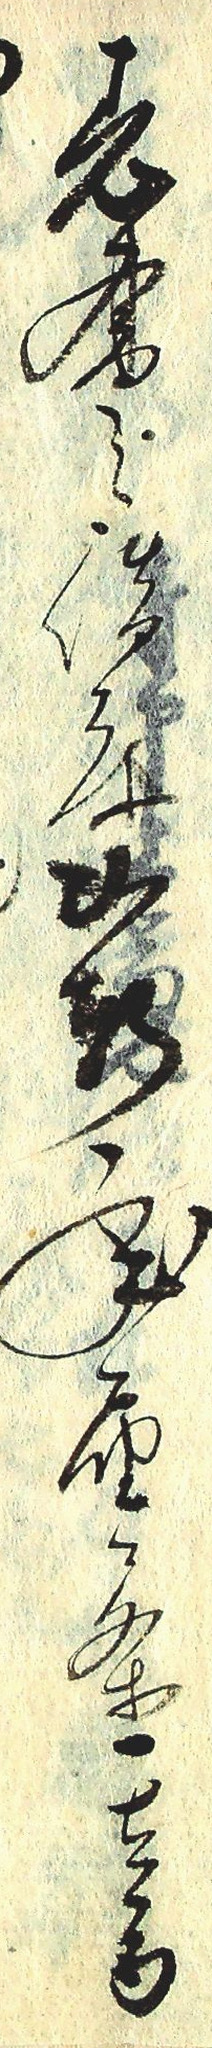表書之借床弐軒承届候条其旨
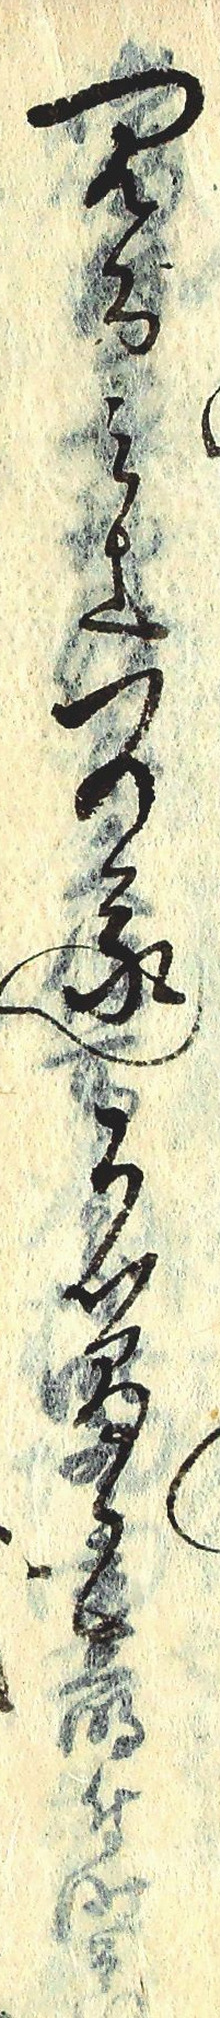見分之上可遂了簡候以上
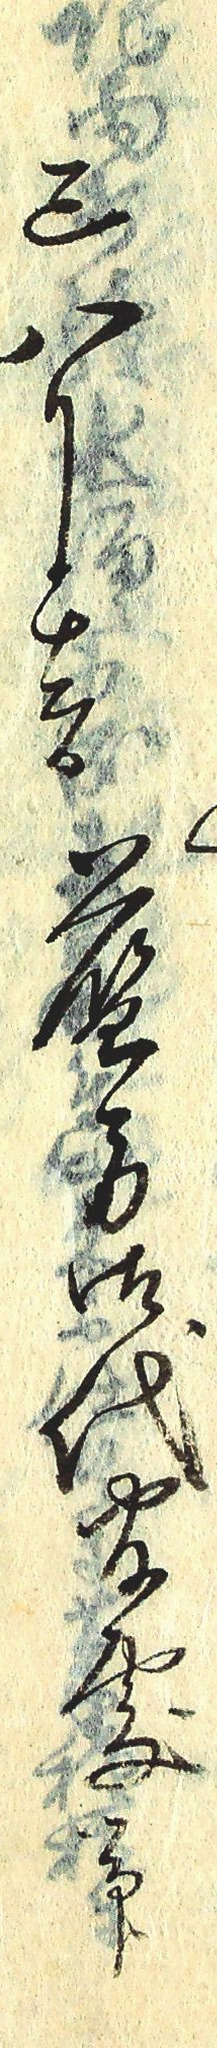巳八月十二日藍方御代官処御印
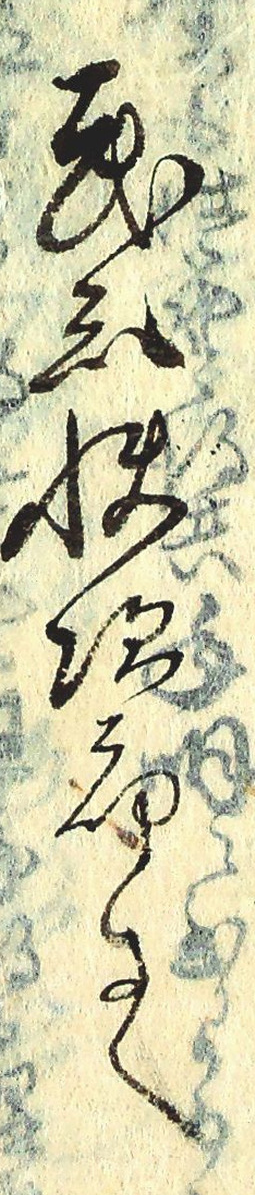武知快次郎方へ
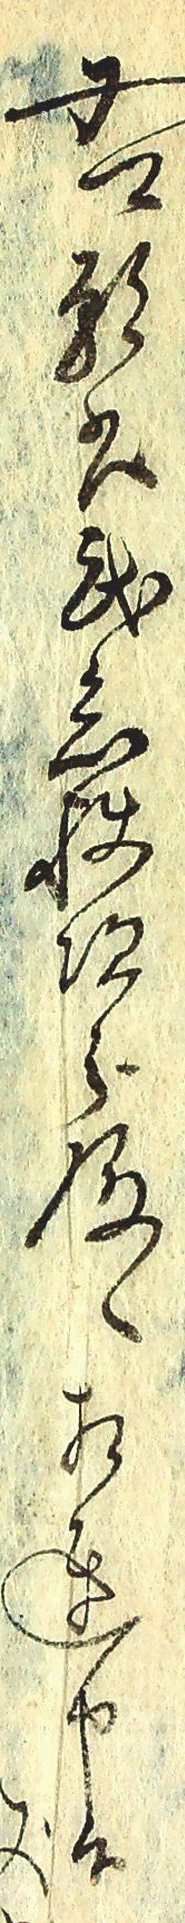右願書武知快次郎殿へ相達申候
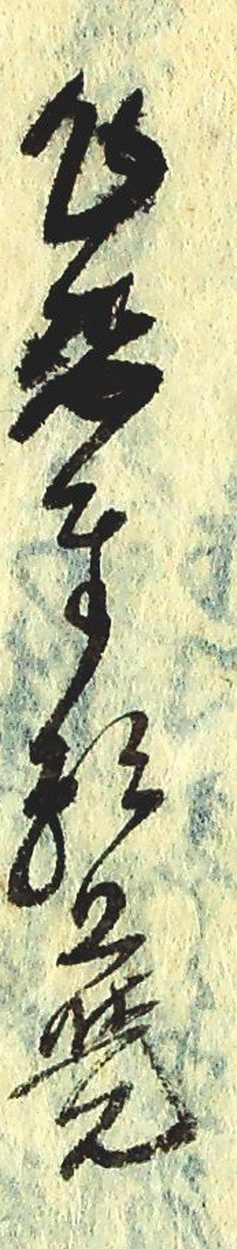乍恐奉願上覚
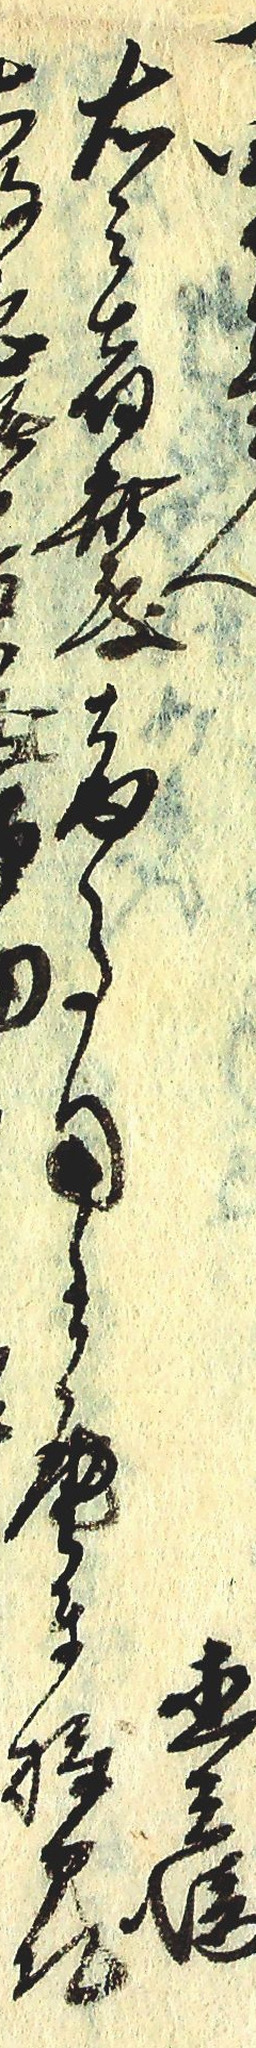右之者此度商事用事御座候付摂州
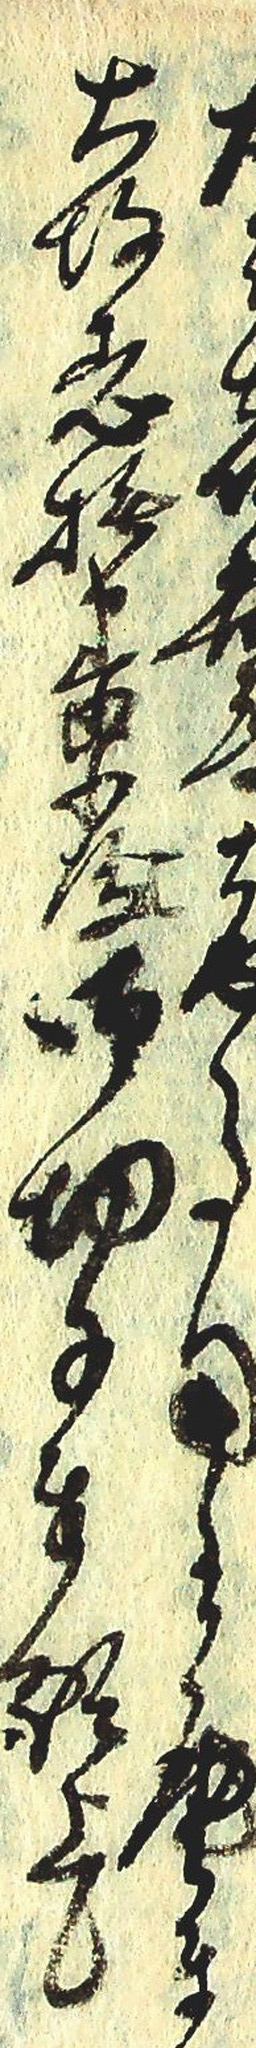大坂表撫養小渡御切手奉願上候
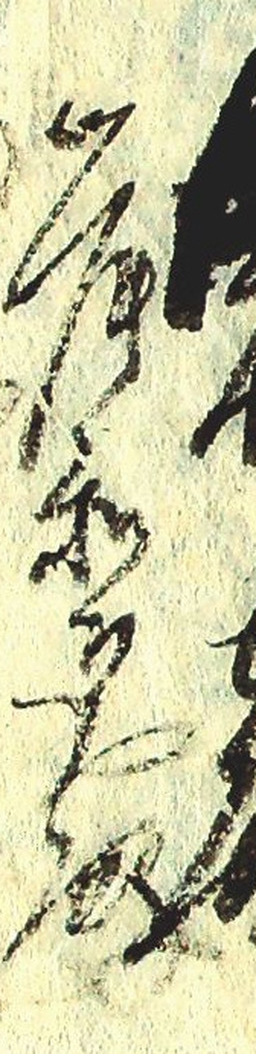岸和右衛門殿
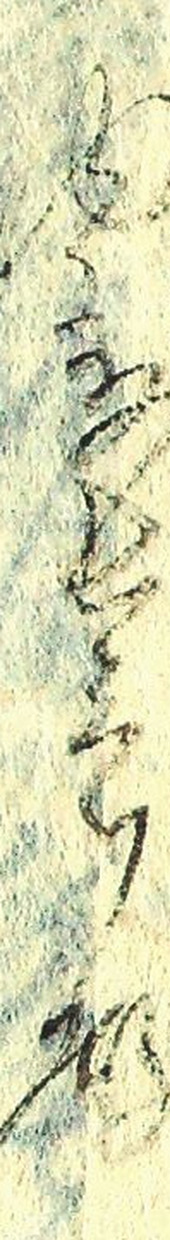内藤長三郎殿

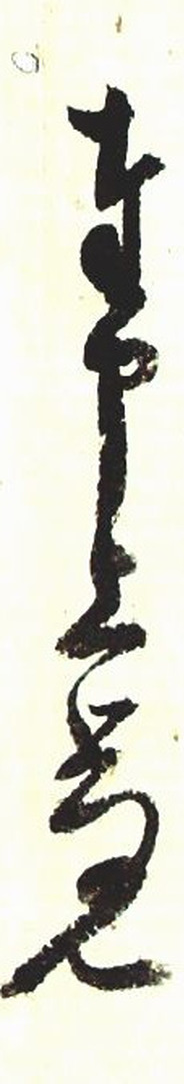奉申上覚
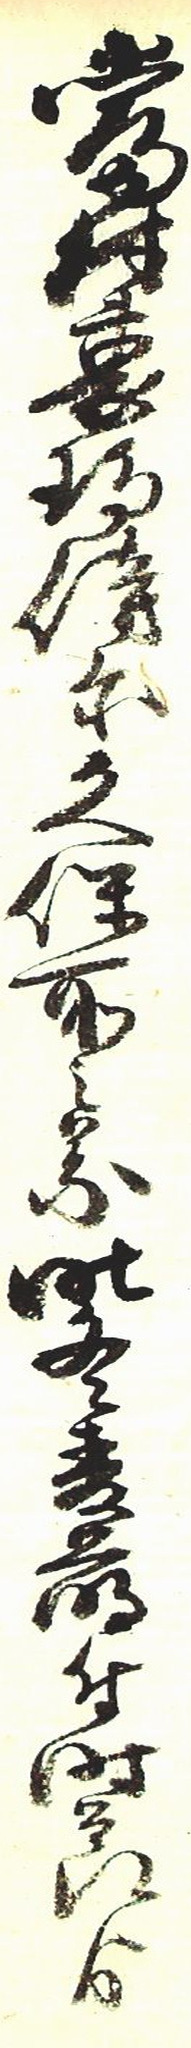当村裏野傍示久保所之義昨冬麦蒔付時節ゟ
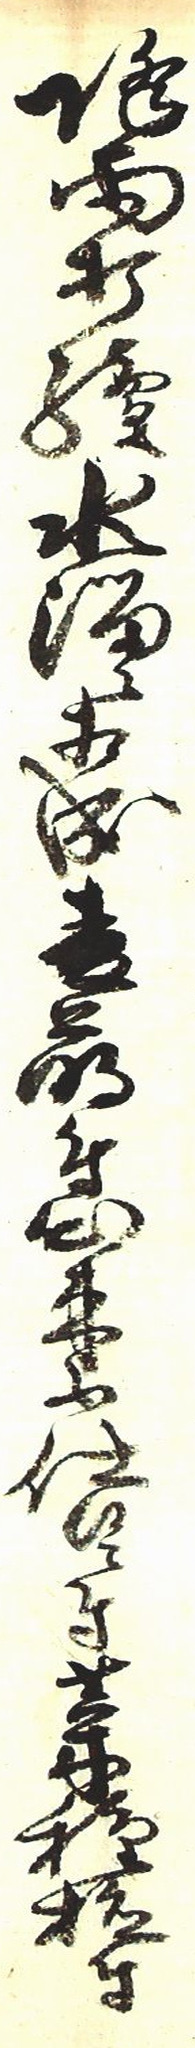降雨打続水溜に相成麦蒔付出来不仕候に付菜種植付
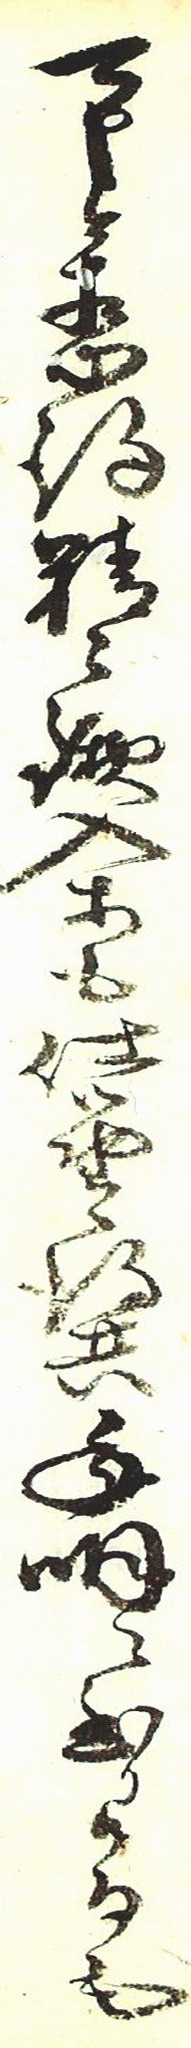可申と相心得精々鍬入等も仕御座候得共手明に至り候ても
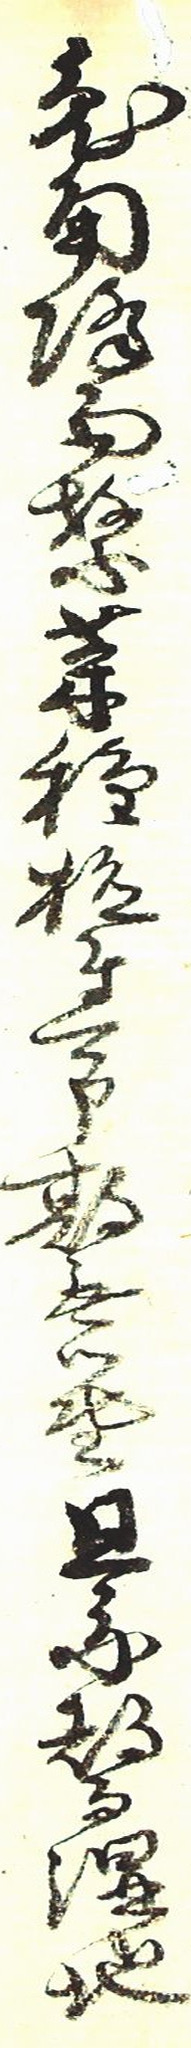兎角降雨繁菜種植付可申期無御座且亦都て湿地
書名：諸御願書控(弐番）
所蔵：鳴門教育大学 Naruto University of Education
